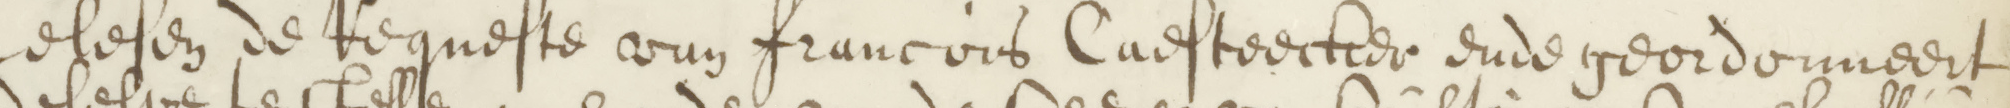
Gelesen de Requeste van Francois Caesteecker ende geordonneert
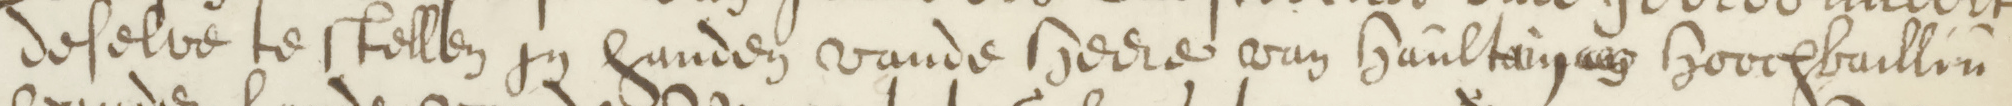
deselve te stellen in handen vande Heere van Haultainxx Hoochbailliu
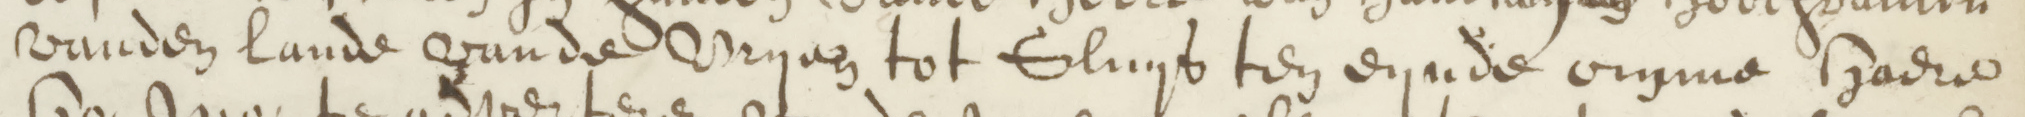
vanden lande vande Vryen tot Sluys ten eynde omme Haere
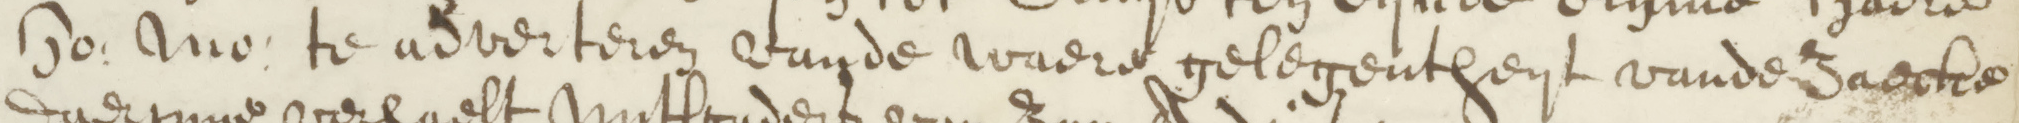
Ho:Mo: te adverteren vande waere gelegentheyt vande Zaecke
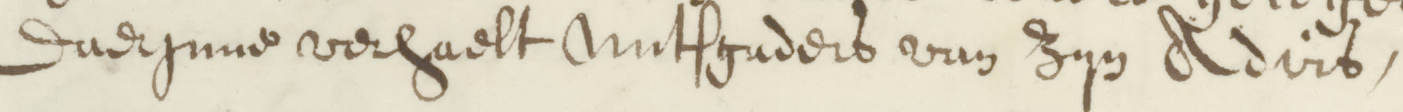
daerinne verhaelt mitsgaders van Zyn Advis.
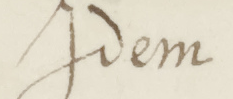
Idem
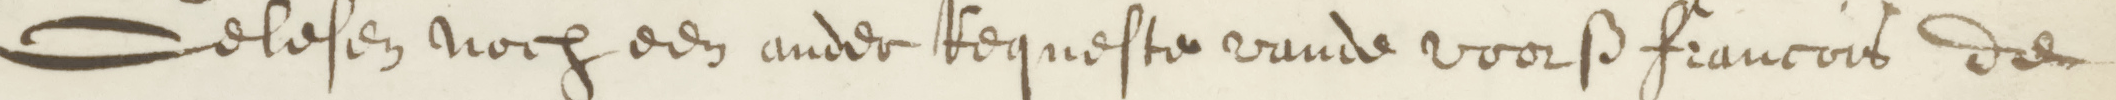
Gelesen noch een ander Requeste vande voors Francois de
